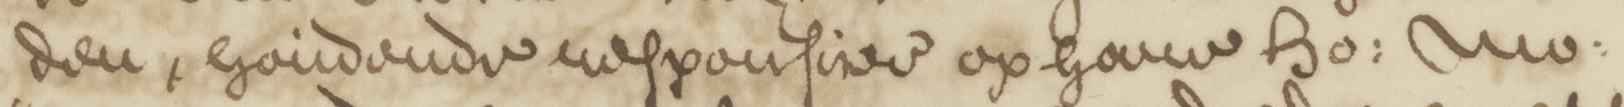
„den, houdende responsive op hare Ho:Mo:
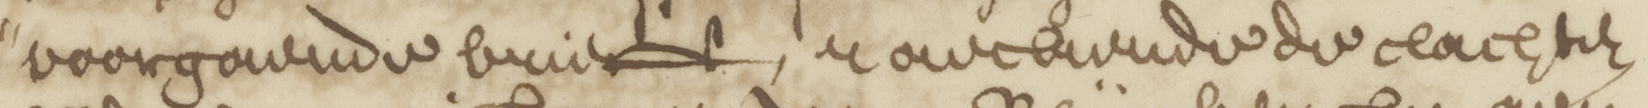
voorgaende brieff, raeckende de clachten
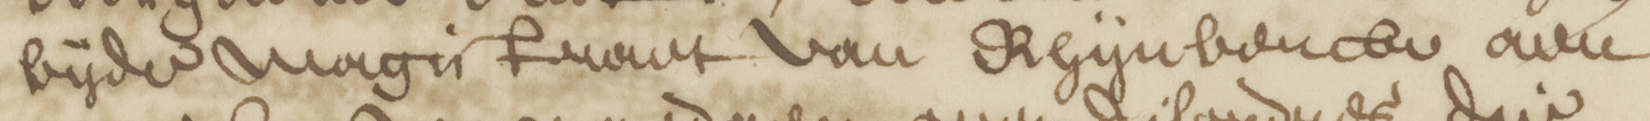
bijde Magistraet van Rhijnberck aen
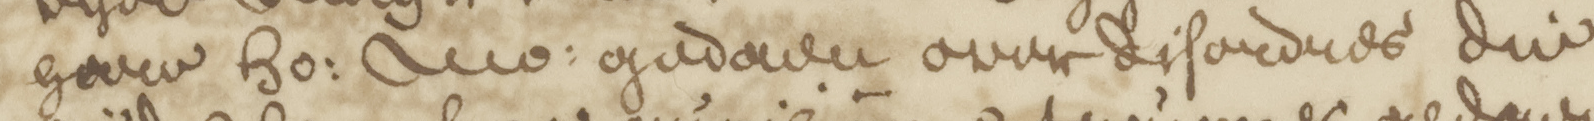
hare ho:Mo: gedaen over disordres die
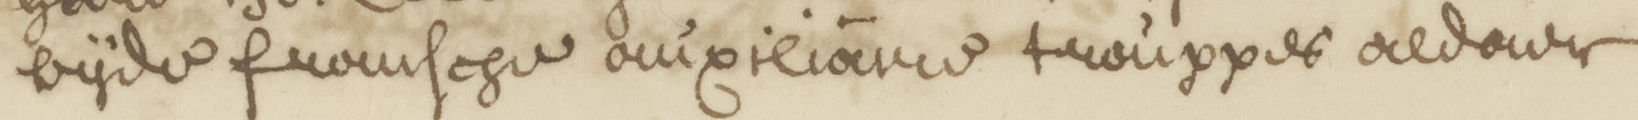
bijde fransche auxiliaire trouppes aldaer
